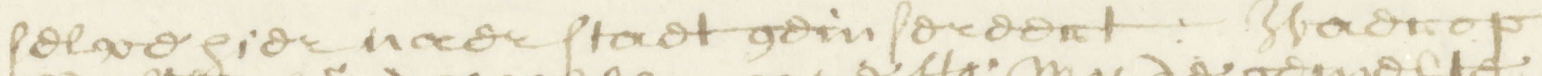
selve hier naer staet geinfereert: Waerop
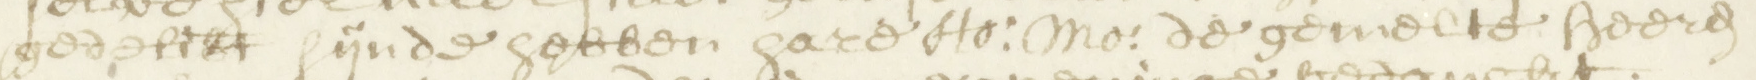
gedelibt sijnde hebben hare Ho:Mo: de gemelte Heeren
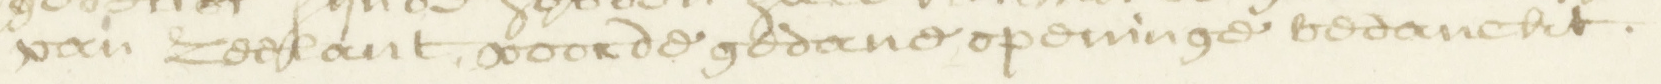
van Zeelant, voorde gedane openinge bedanckt.
